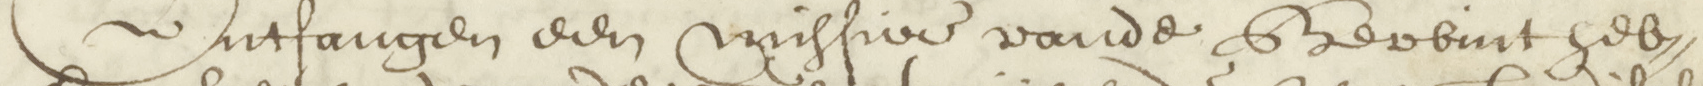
Ontfangen een missive vande Bewintheb„
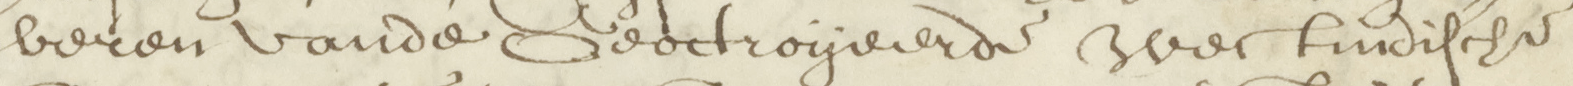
beren vande Geoctroijeerde Westindische
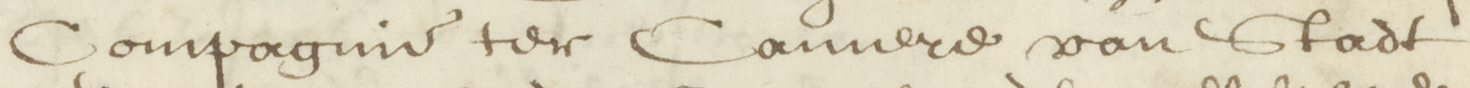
Compagnie ter Camere van Stadt
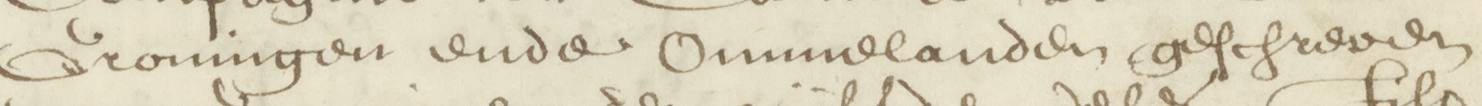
Groningen ende Ommelanden geschreven
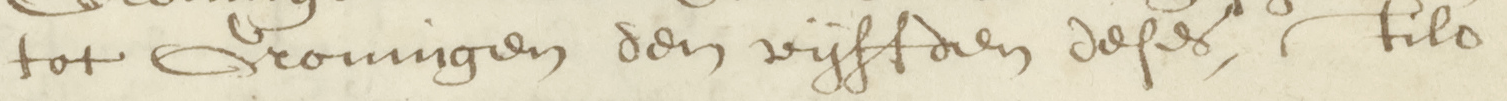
tot Groningen den vijffden deses, stilo
